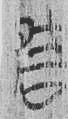唯
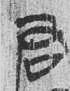君
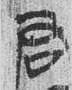君
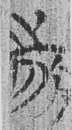之所
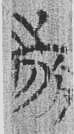所
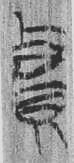貴
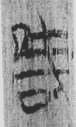唯
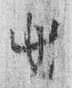心
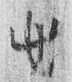心
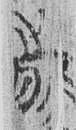之所
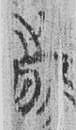所
